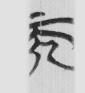而
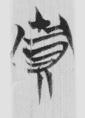賈
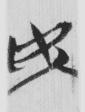𡚦
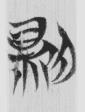則
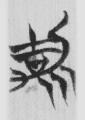劼
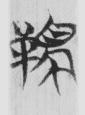{矢蜀}
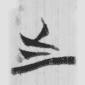之
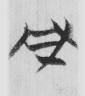凡
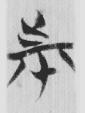市
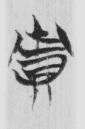賈
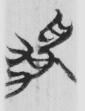爭
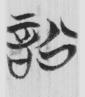訟
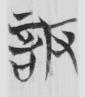{言反}
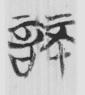{言不}
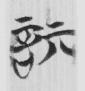{言亓}
